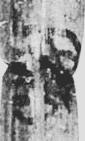含
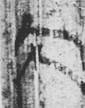大
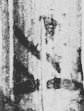之
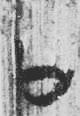㠯（以）
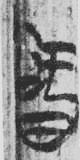智（知）
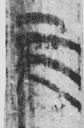天
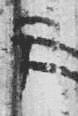下
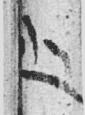少（小）
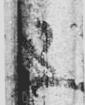之
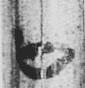㠯（以）
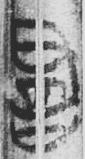○（治）
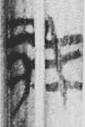邦
